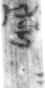季子
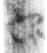女
